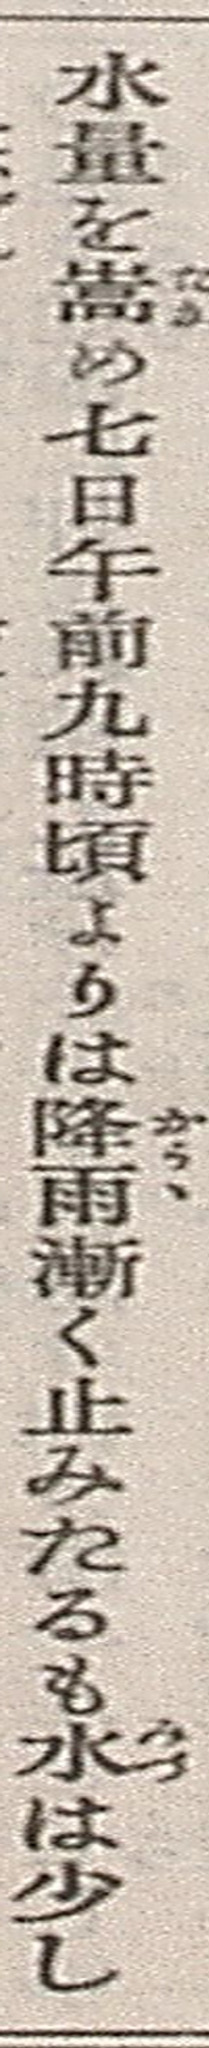水量を嵩め七日午前九時頃よりは降雨漸く止みたるも水は少し
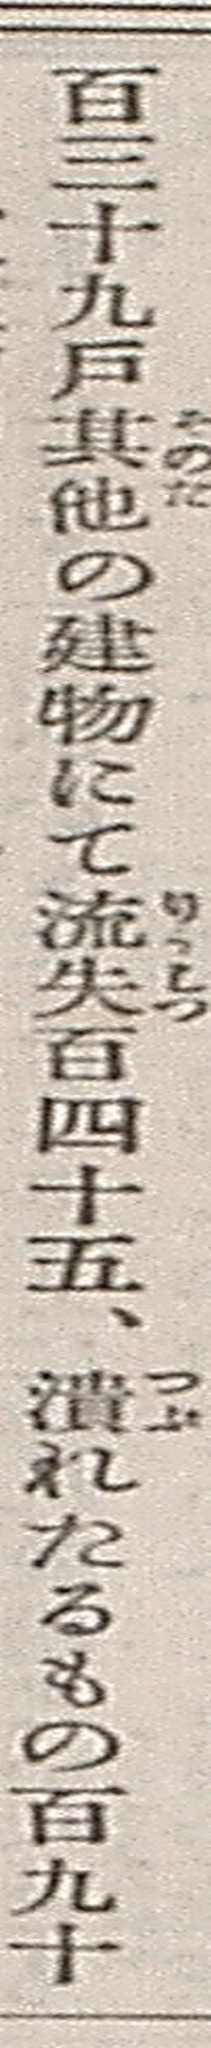百三十九戸其他の建物にて流失百四十五、潰れたるもの百九十
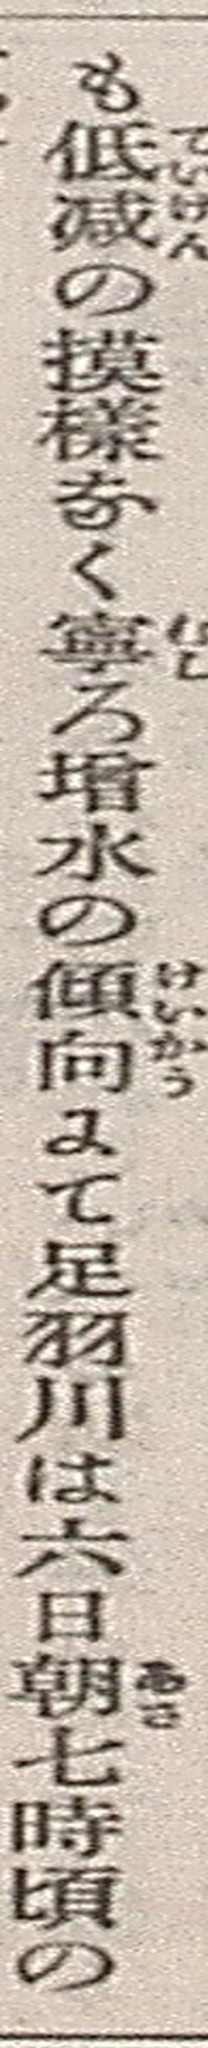も低減の模様なく寧ろ増水の傾向にて足羽川は六日朝七時頃の
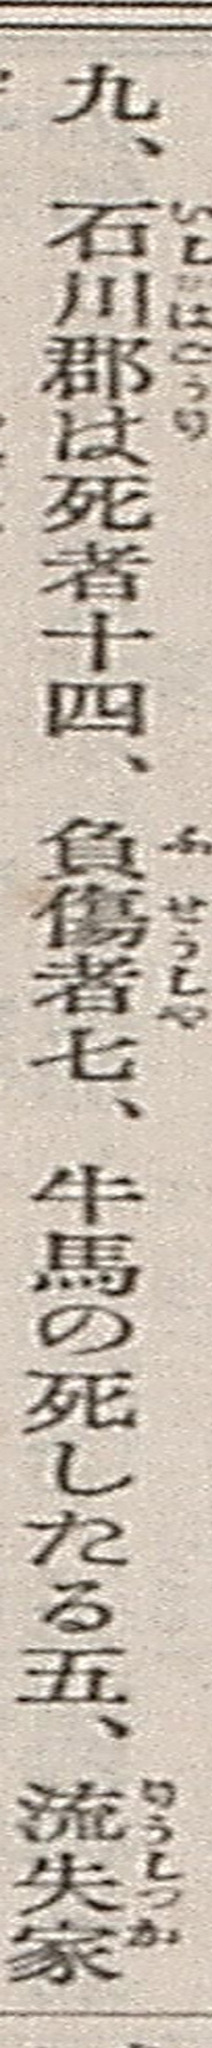九、石川郡は死者十四、負傷者七、牛馬の死したる五、流失家
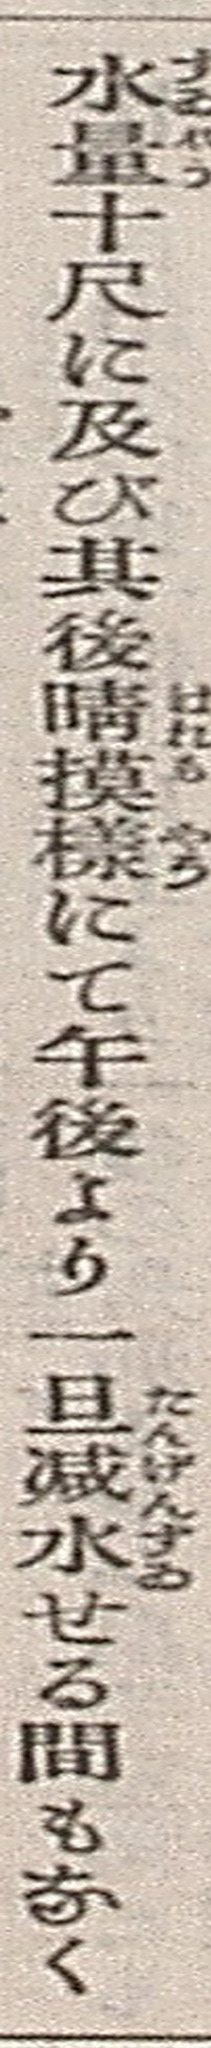水量十尺に及び其後晴模様にて午後より一旦減水せる間もなく
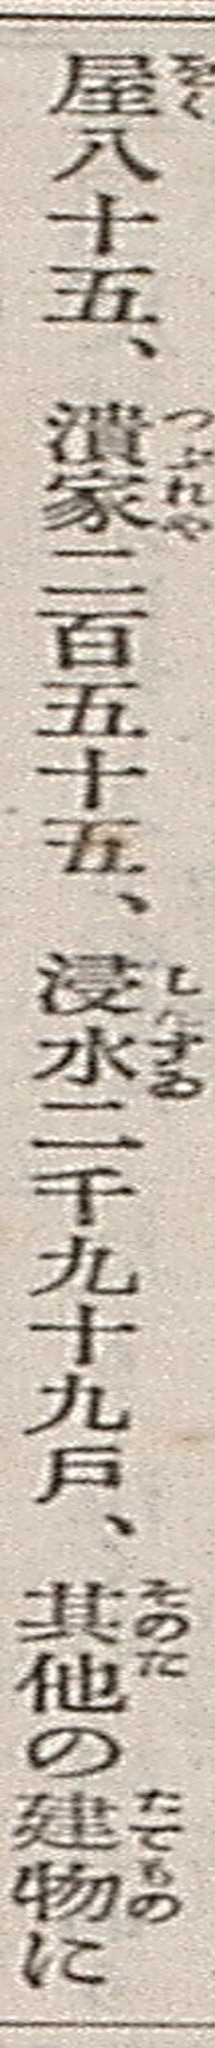屋八十五、潰家二百五十五、浸水二千九十九戸、其他の建物に
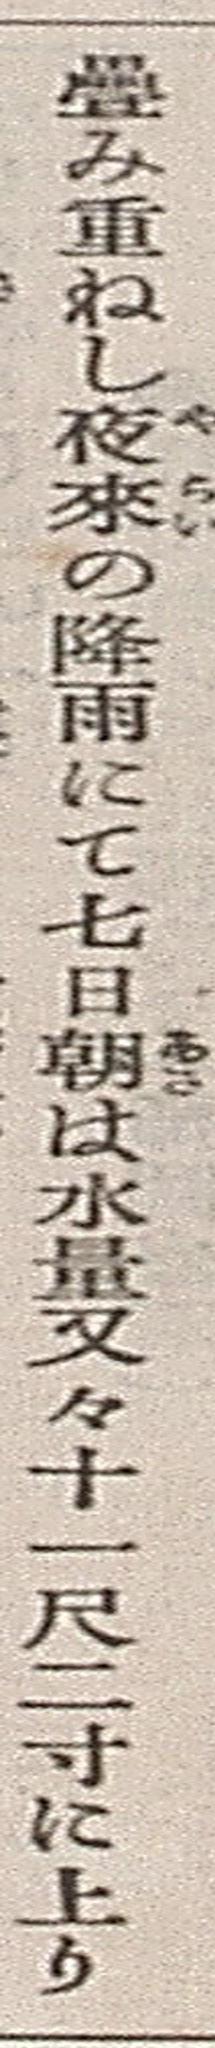畳み重ねし夜来の降雨にて七日朝は水量又々十一尺二寸に上り
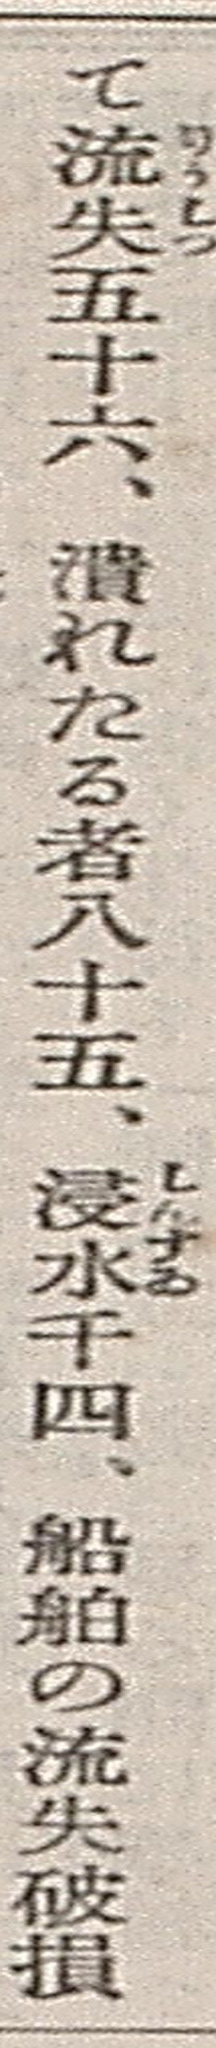て流失五十六、潰れたる者八十五、浸水千四、船舶の流失破損
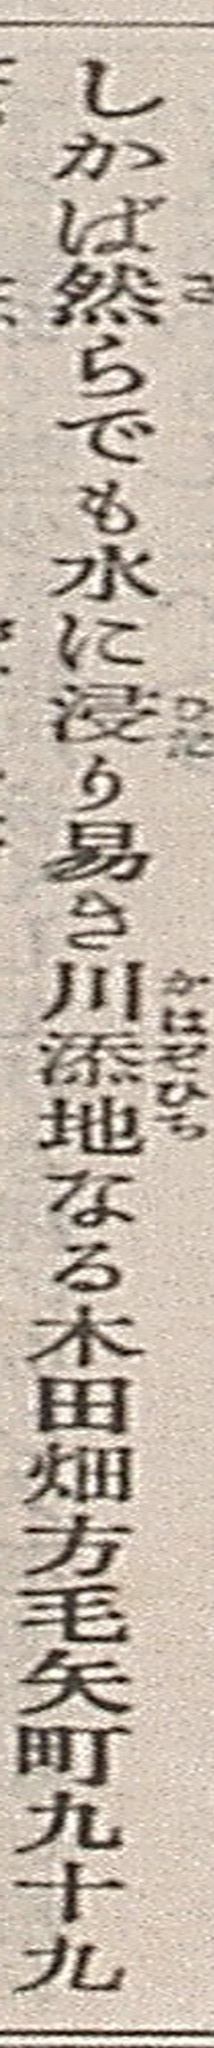しかば然らでも水に浸り易き川添地なる水田畑方毛矢町九十九
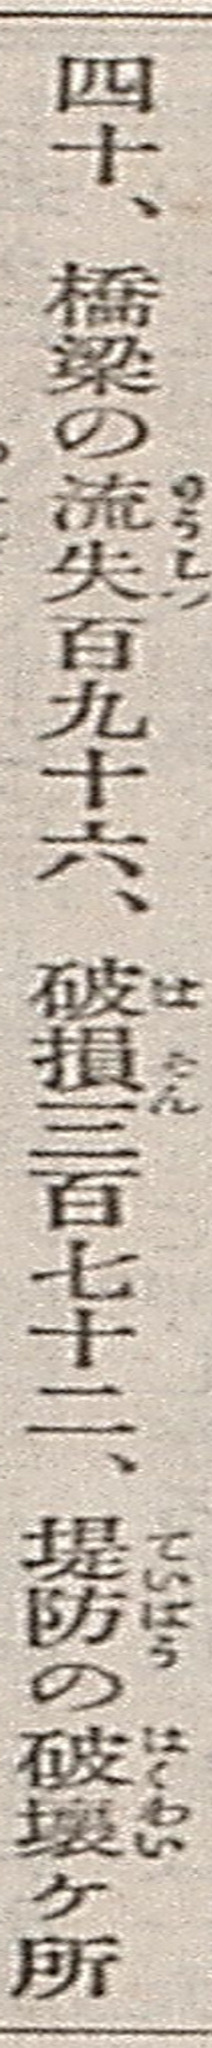四十、橋梁の流失百九十六、破損三百七十二、堤防の破壊ヶ所
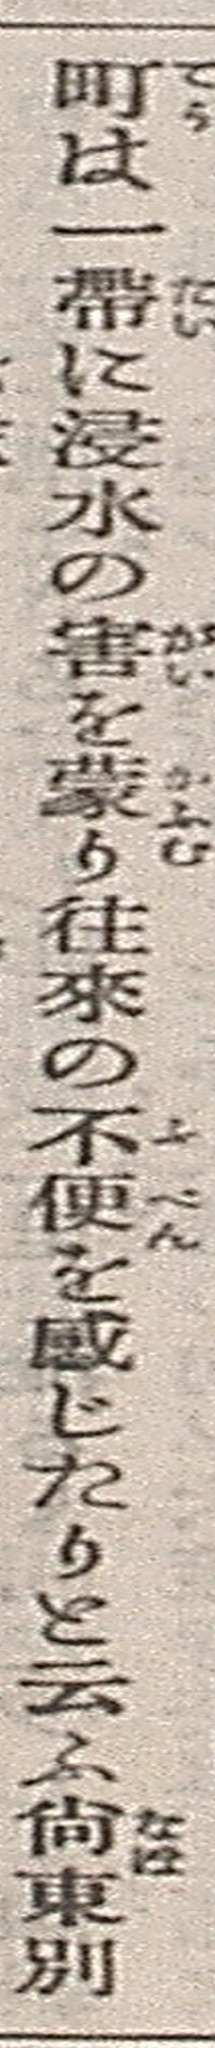町は一帯に浸水の害を蒙り往来の不便を感じたりと云ふ尚東別
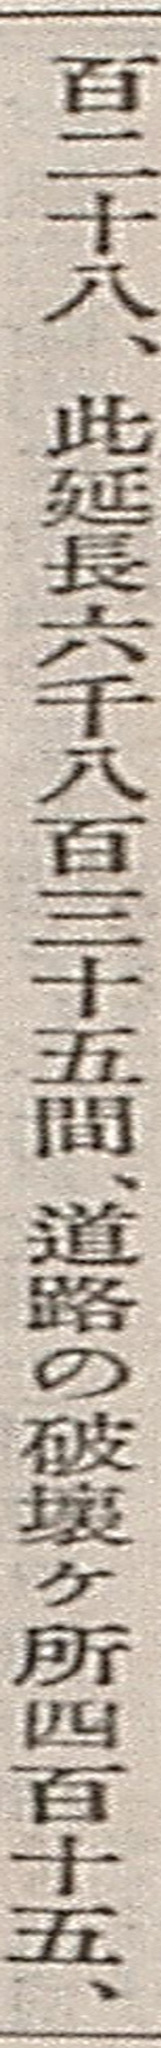百二十八、此延長六千八百三十五間、道路の破壊ヶ所四百十五、
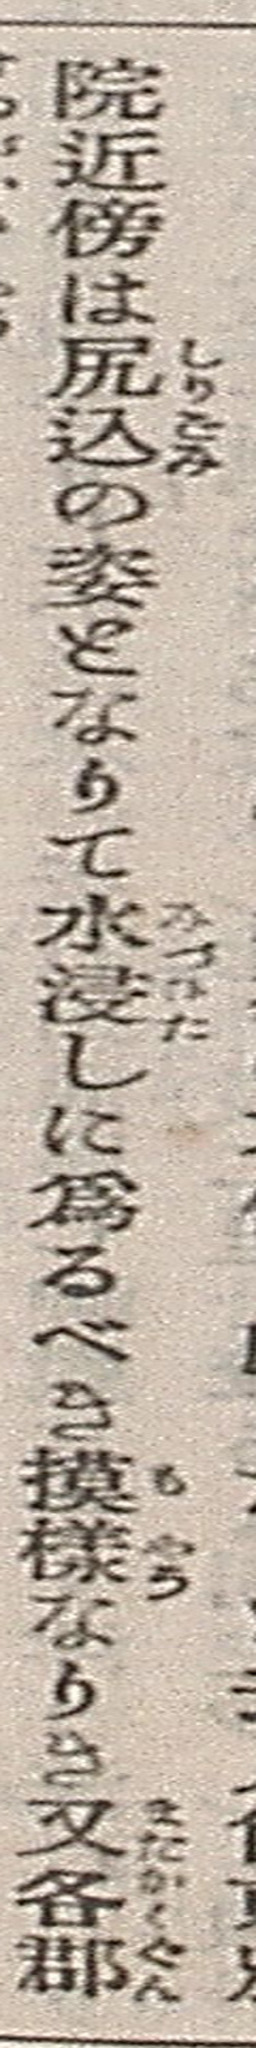院近傍は尻込の姿となりて水浸しに為るべき模様なりき又各郡
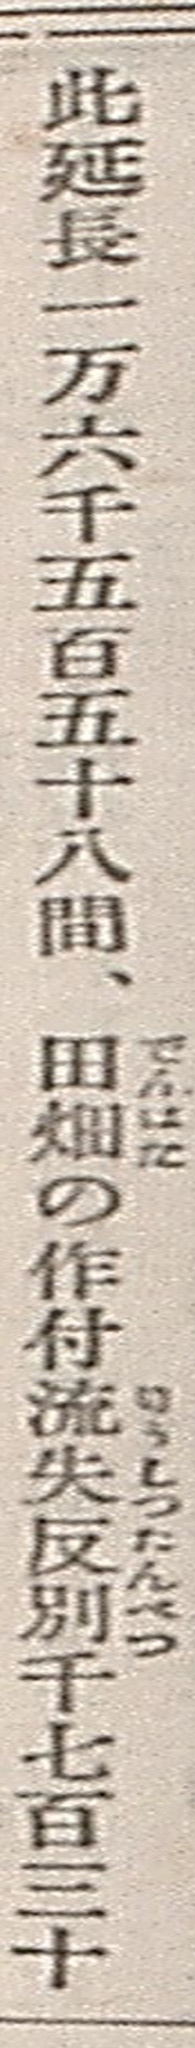此延長一万六千五百五十八間、田畑の作付流失反別千七百三十
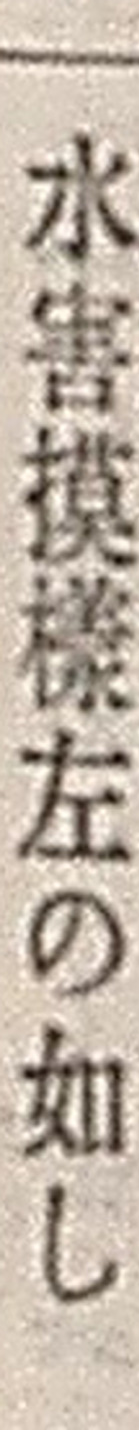水害模様左の如し
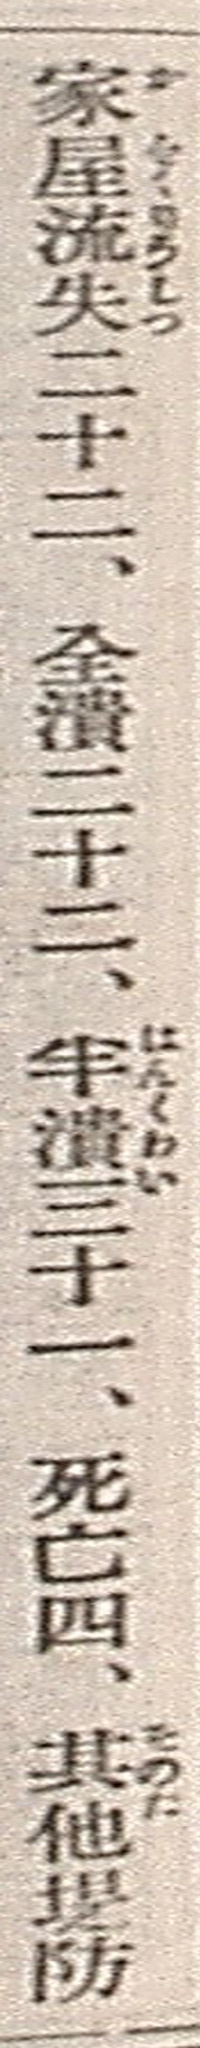家屋流失二十二、全潰二十二、半潰三十一、死亡四、其他堤防
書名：風俗畫報臨時増刊第百二十八號　洪水被害録（下）
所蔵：東京大学地震研究所図書室 Earthquake Research Institute Library, The University of Tokyo, JAPAN
